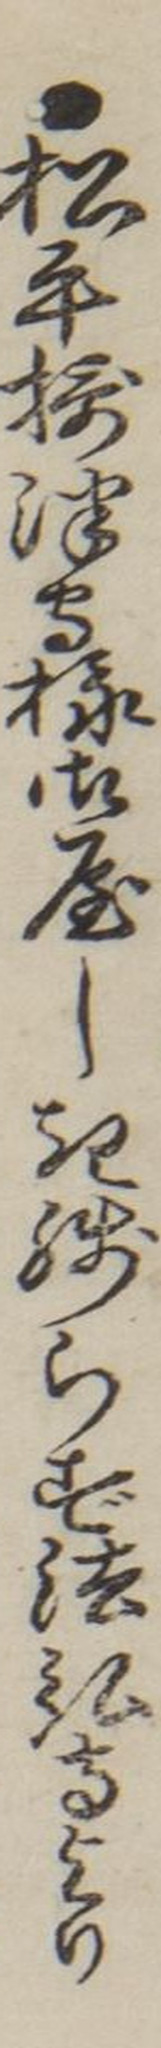●松平摂津守様御屋しき残らず法弘寺より
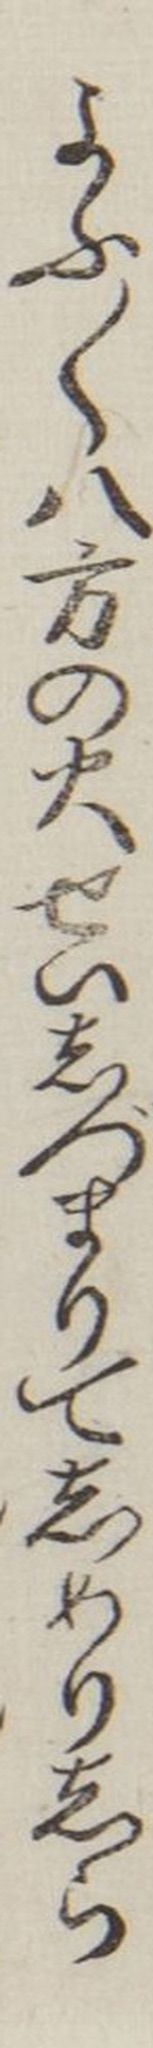よふ〳〵八方の火せいしづまりてしめりしら
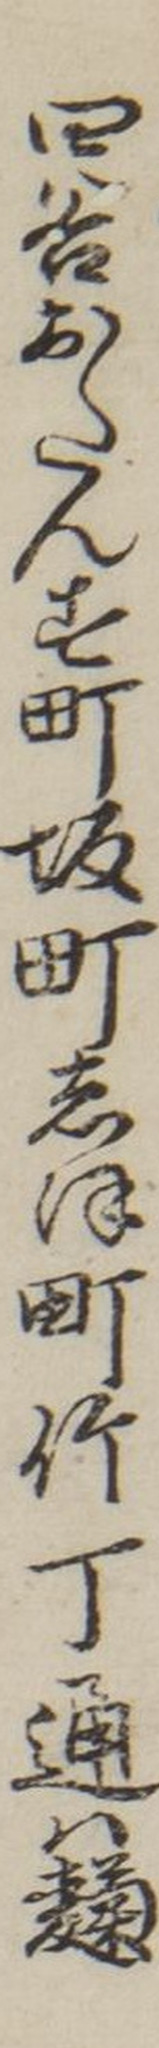四谷おたんす町坂町しほ町竹丁通は麹
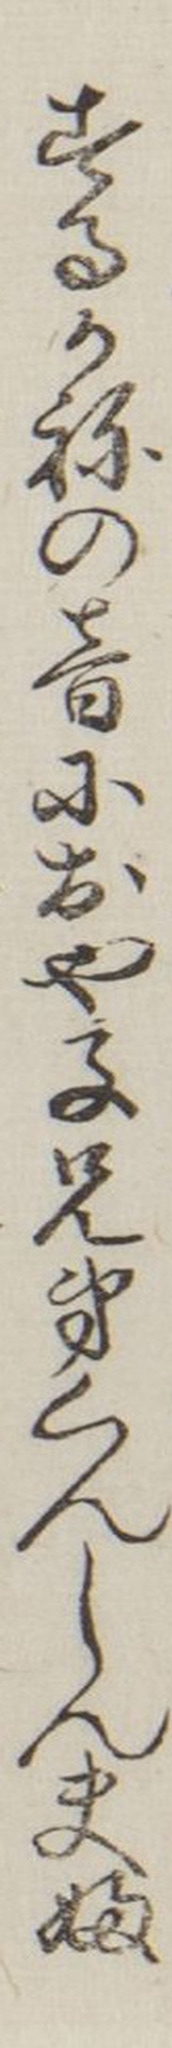するかねの音におや子兄弟くんしん夫婦
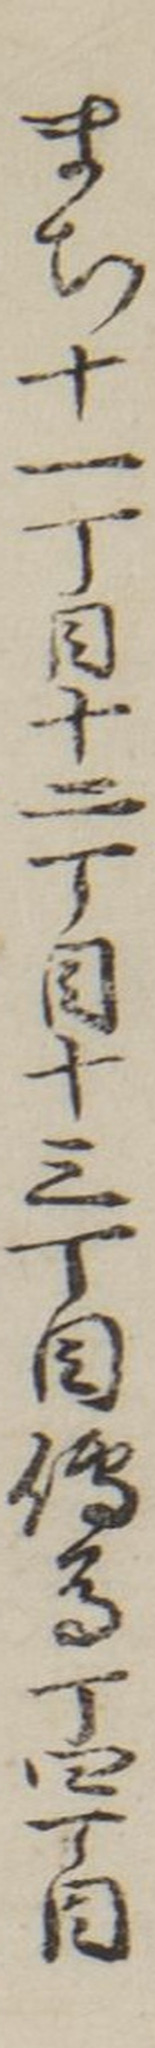まち十一丁目十二丁目十三丁目伝馬丁四丁目
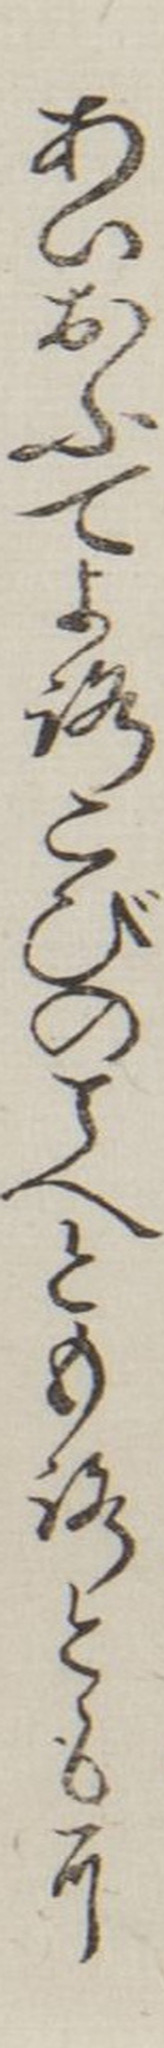あいおふてよろこびのこへともろともに
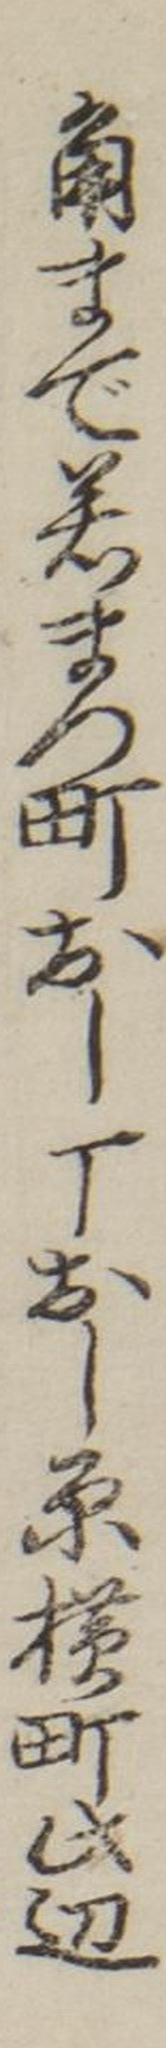角まで若まつ町おし丁おし原横町此辺
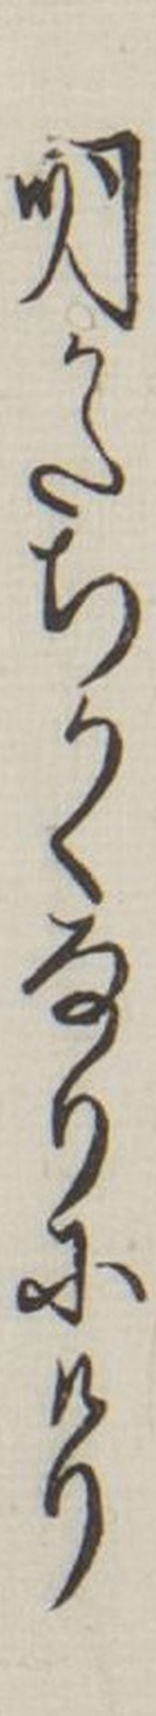明かたちかくなりにけり
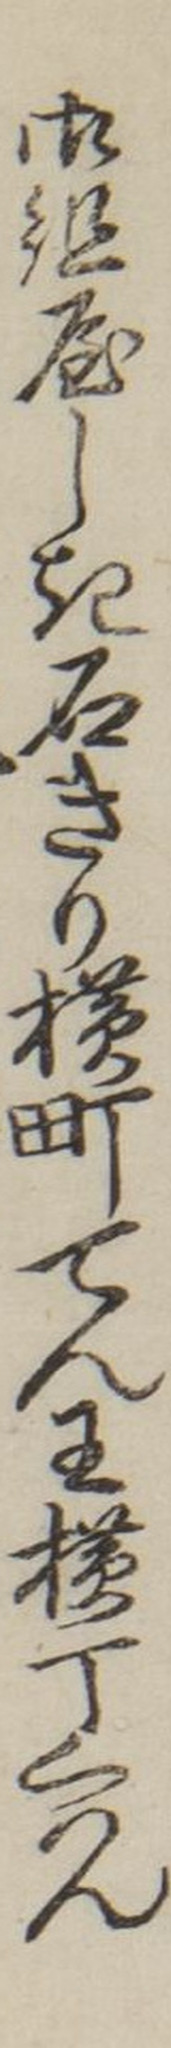御組屋しき石きり横町てん王横丁くはん
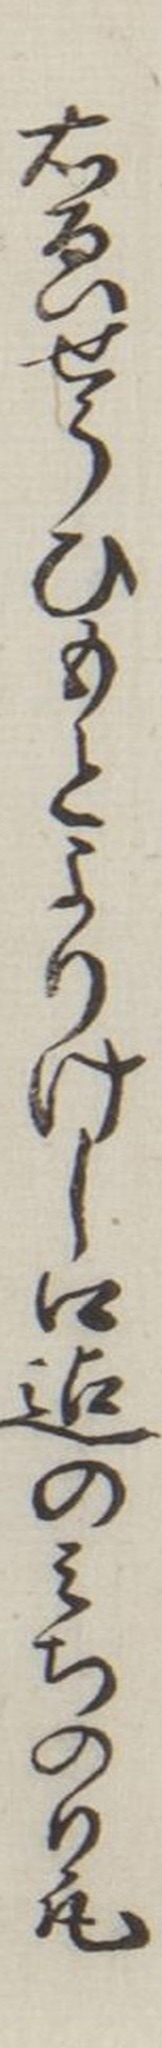右るいせうひのもとよりけし口迄のみちのり凡
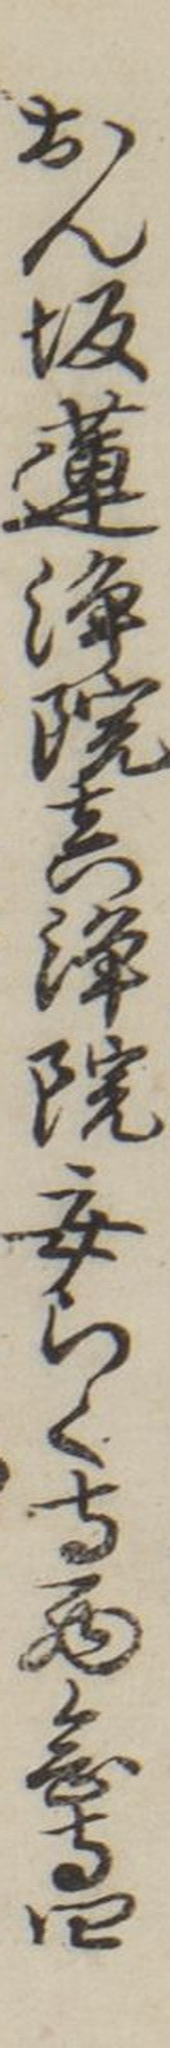おん坂蓮浄院真浄院安らく寺西念寺四
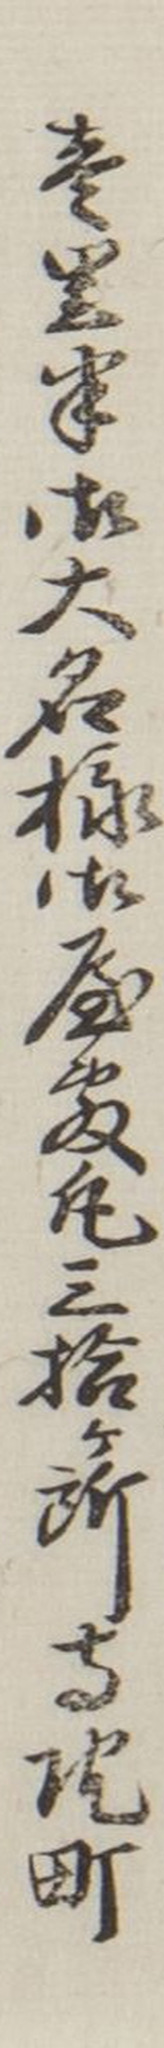壱里半御大名様御屋敷凡三拾ヶ所寺院町
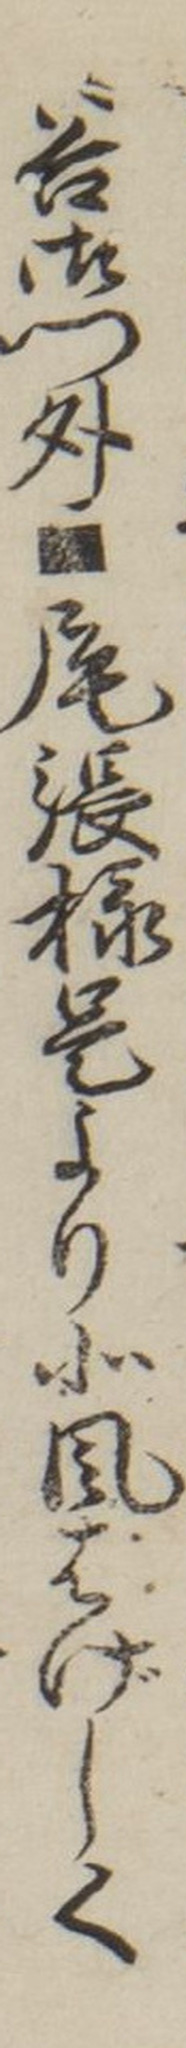谷御門外尾張様是より北風はげしく
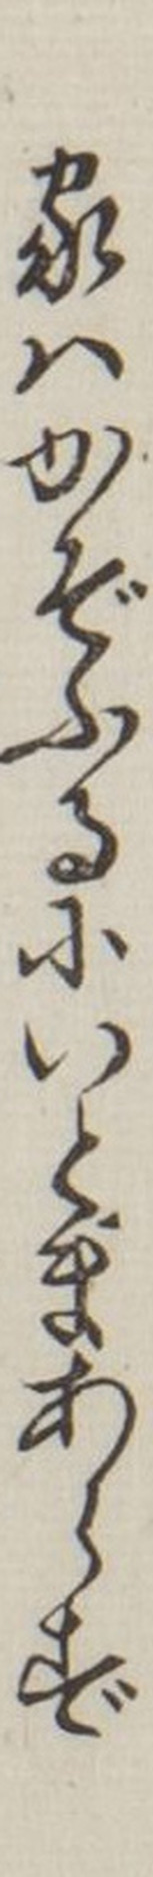家はかぞふるにいとまあらず
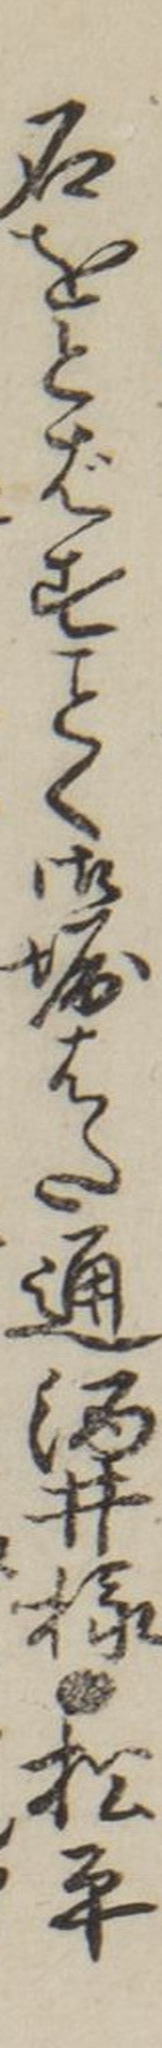石をとばすことく御堀はた通酒井様●松平
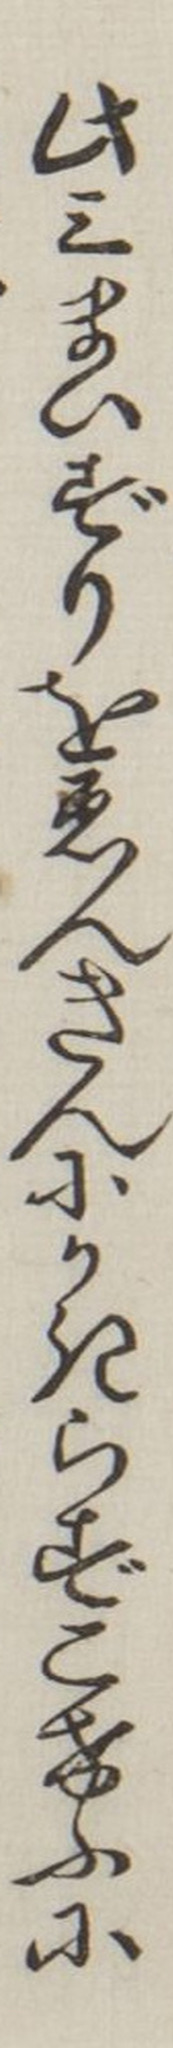此三まいずりをゑんきんにかきらずこけふに
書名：るいせう道しるベ　上・中・下
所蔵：あいおいニッセイ同和損保株式会社
